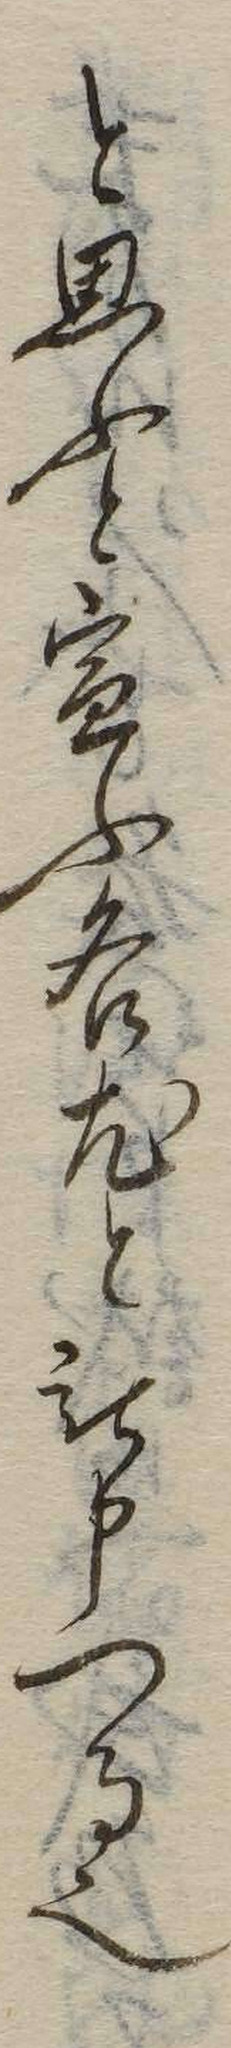と思ふと宣ふ各尤と被申つる也
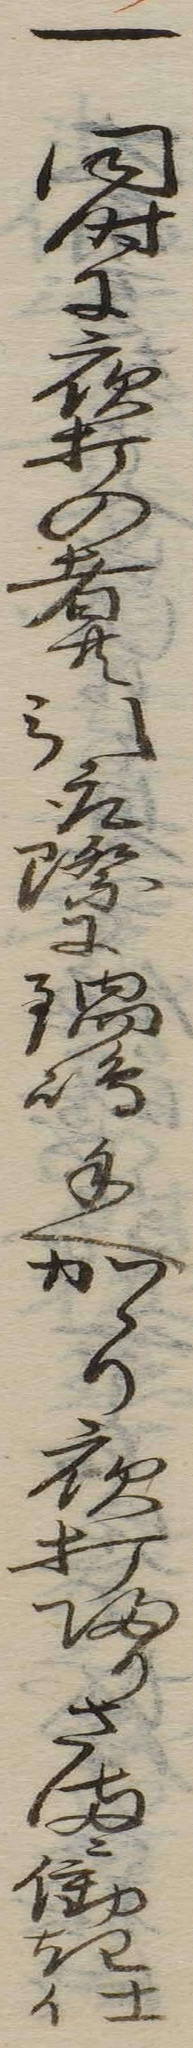一同時に夜打の者共引取際に鍋嶋手へかゝり夜打帰りさまに働き仕
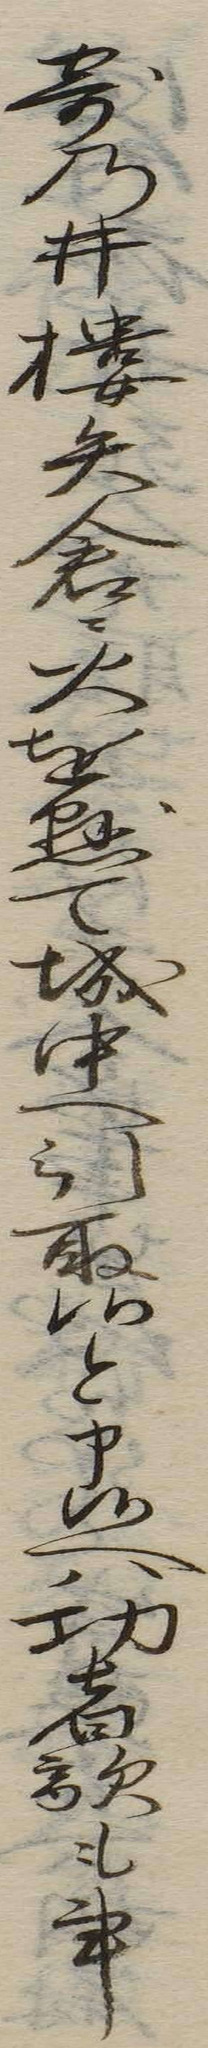寄の井楼矢倉ニ火を懸て城中へ引取候と申候へは功者敵も事
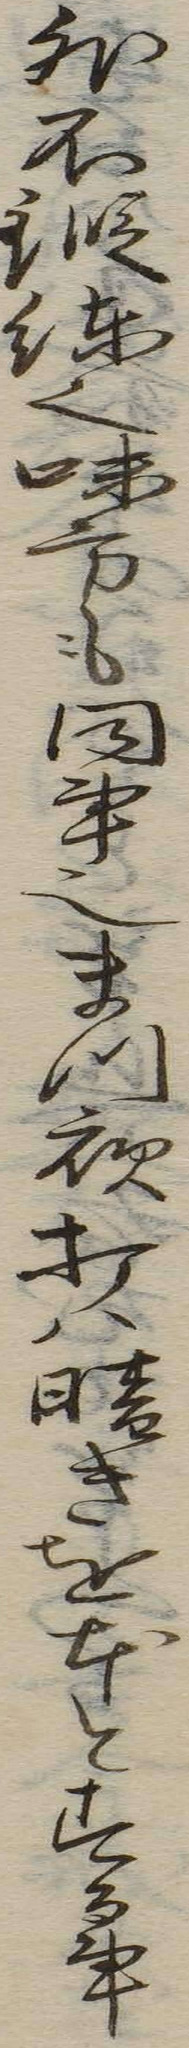外不鍛錬也味方も同事也まつ夜打は暗きを本とする事
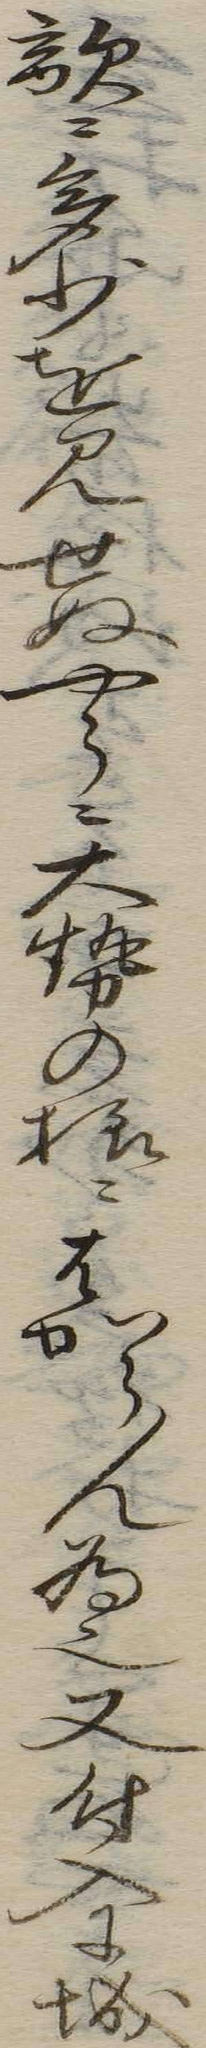敵ニ多少を見せぬやうニ大勢の様ニはからん為也又付入に城
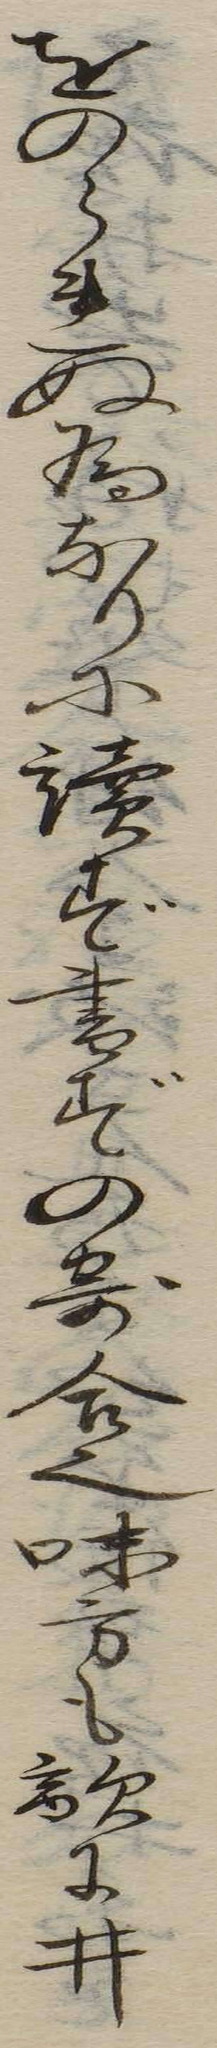をのられぬ為なりに読ず書ずの寄合也味方も敵に井
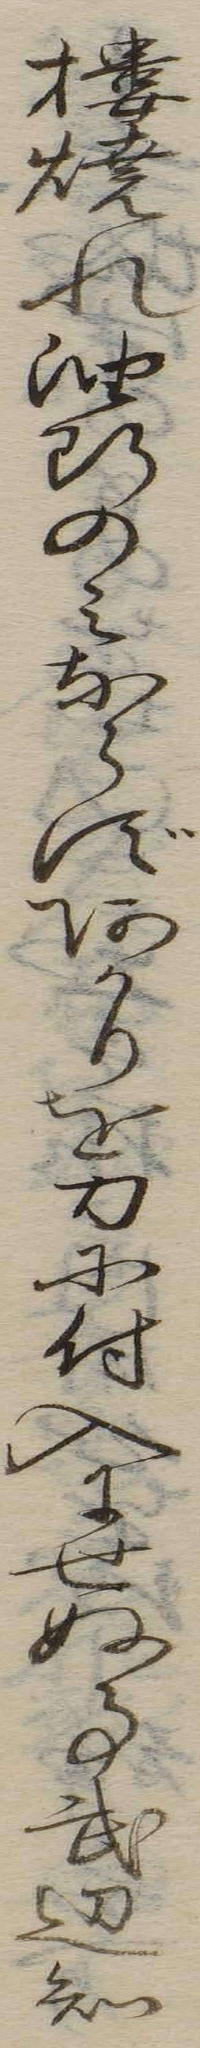楼焼れ油断のみならずあかりを力に付入にせぬ事武辺知
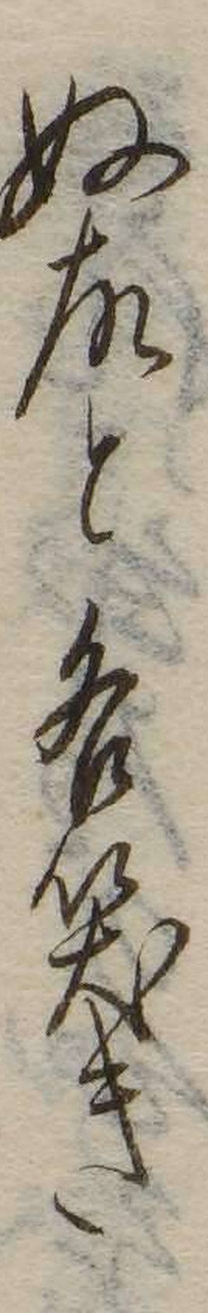ぬ故と各笑き
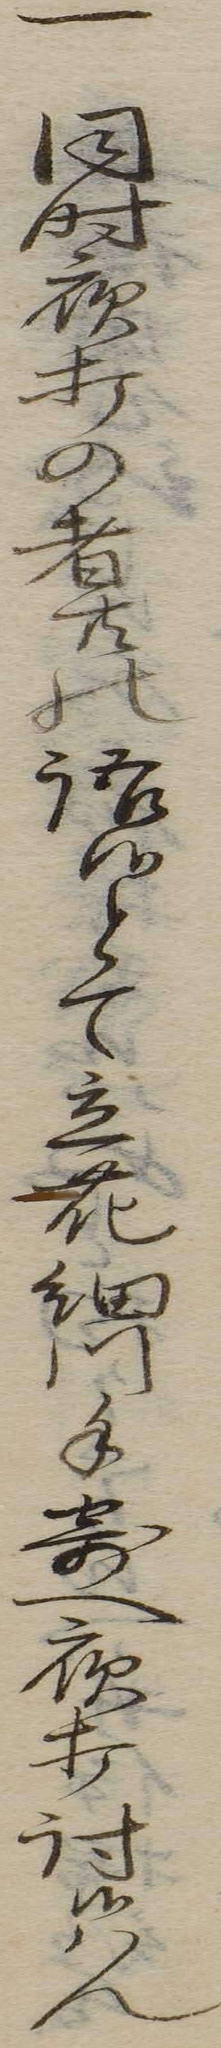一同時夜打の者共の語候とて立花細川手寄へ夜打討候はん
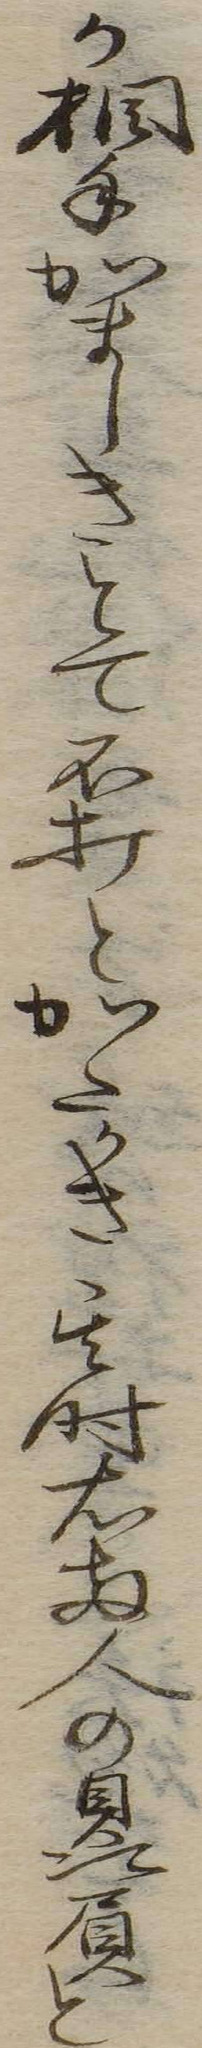か相手かましきとて不打とかたりき其時右両人のみ贔屓と

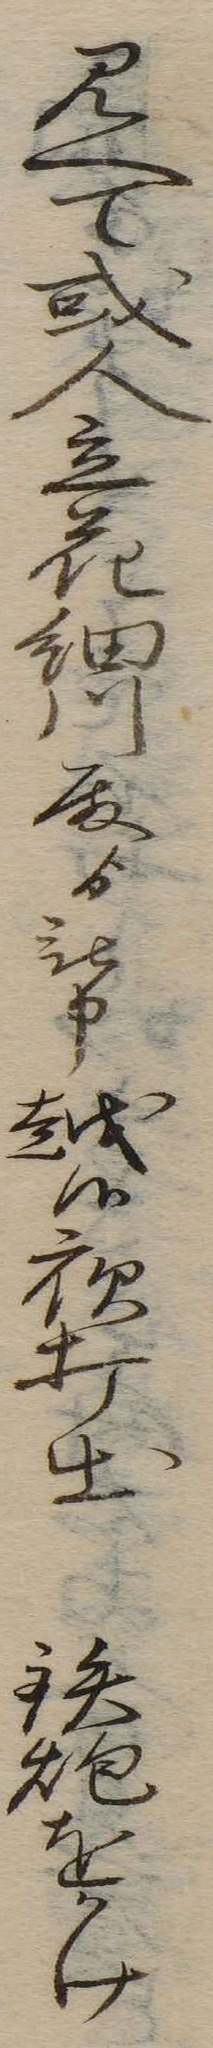見へて或人立花細川殿ゟ被申越候夜打出鉄炮をかけ
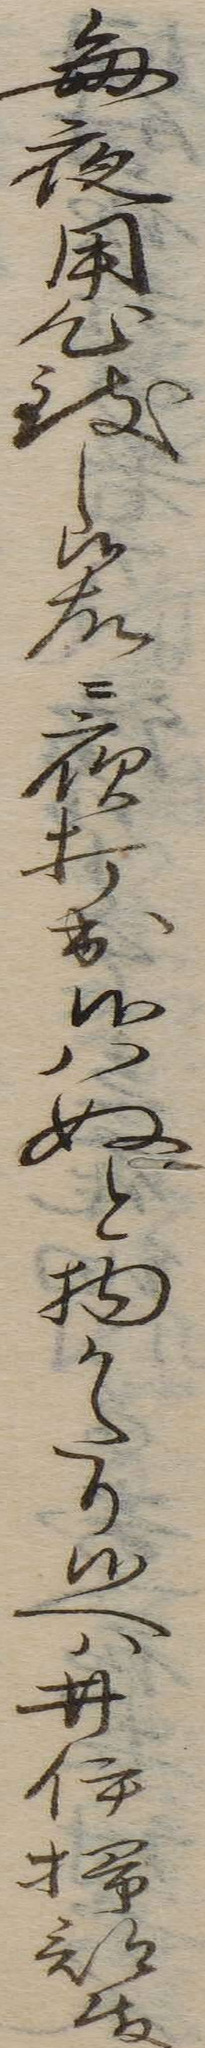毎夜用心致し候故ニ夜打出候はぬと物かたり候へは井伊掃部殿
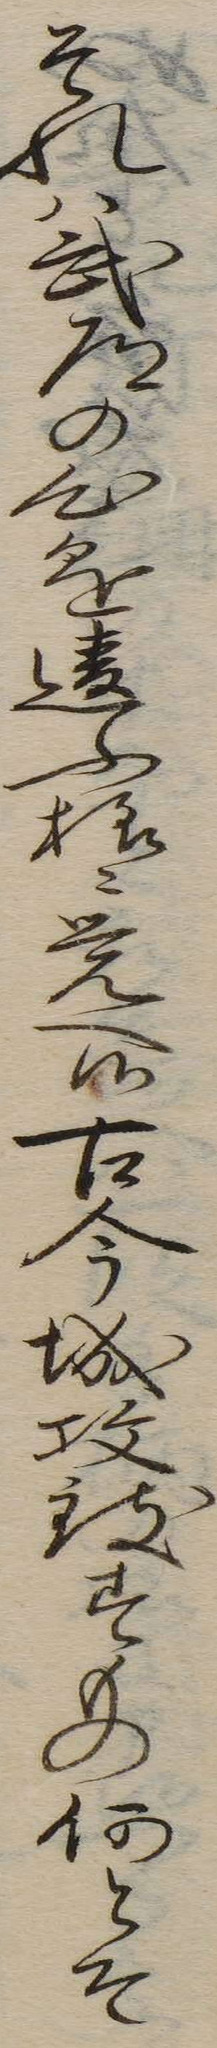それは武道の心懸違ふ様に覚へ候古今城攻致すもの何とそ
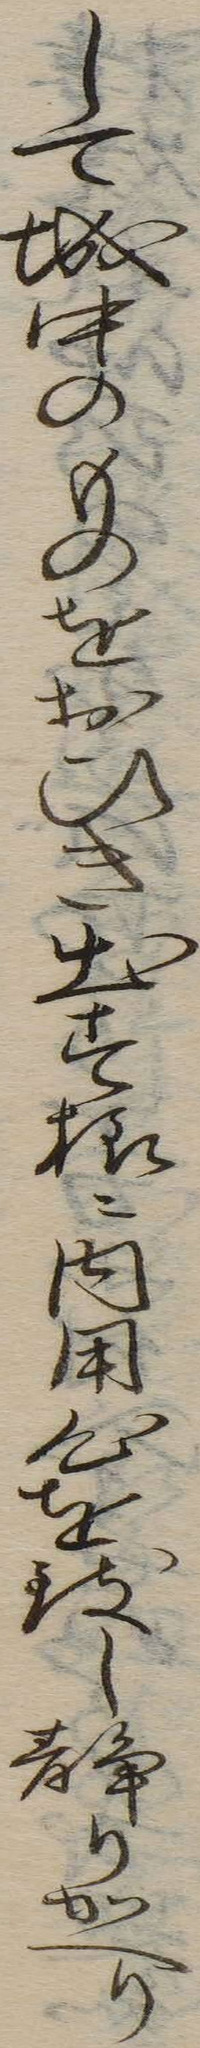して城中のものをおひき出す様ニ内用心を致し静りかへり
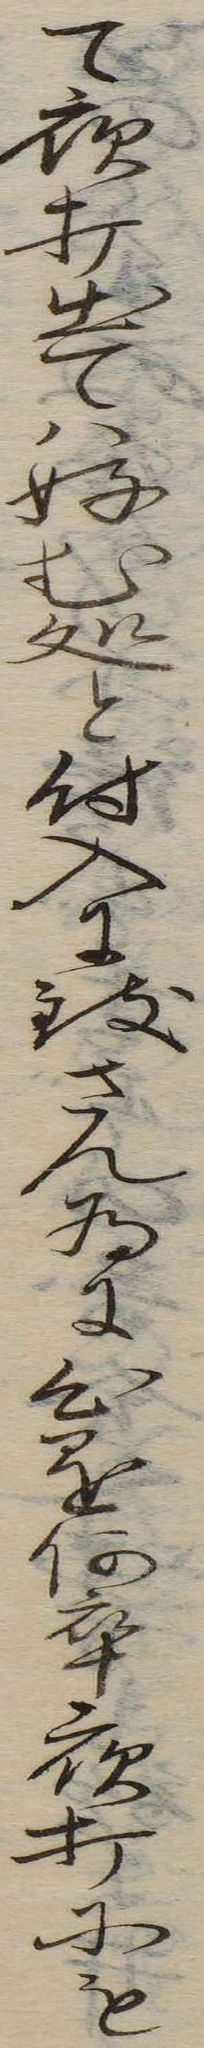て夜打出ては好む処と付入に致さん為に心懸何卒夜打にも
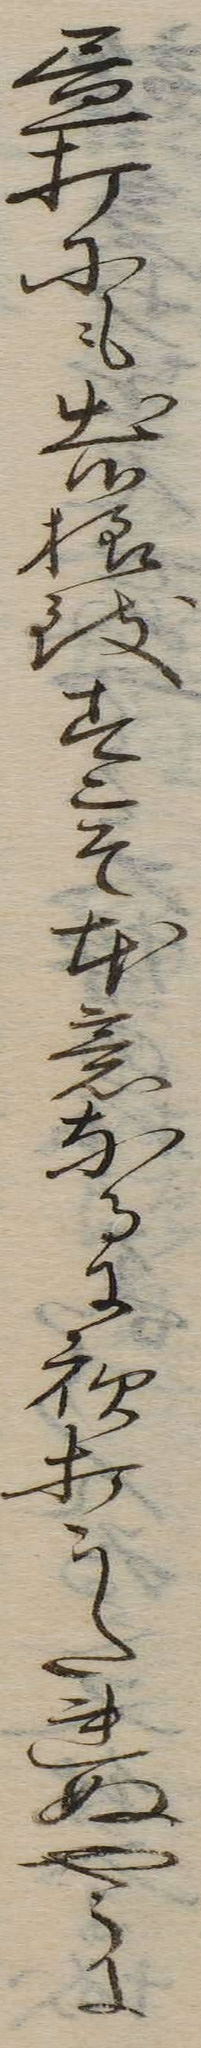昼打にも出候様致すこそ本意なるに夜打うたれぬやうに
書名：三河之物語
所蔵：国文学研究資料館
